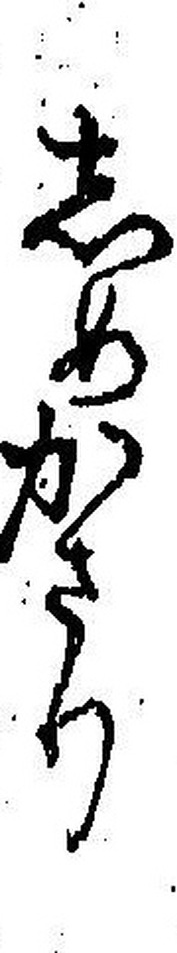しめかさり
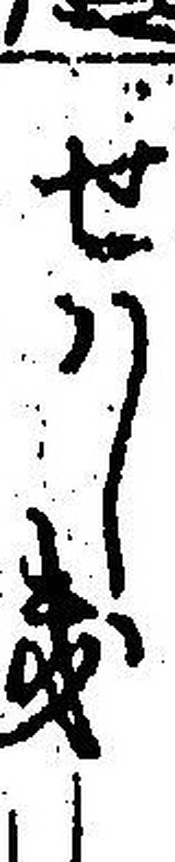せはしき

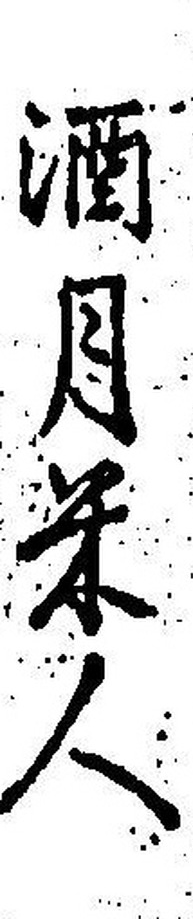酒月米人
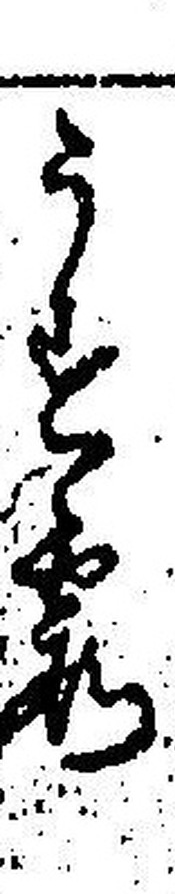うす霞
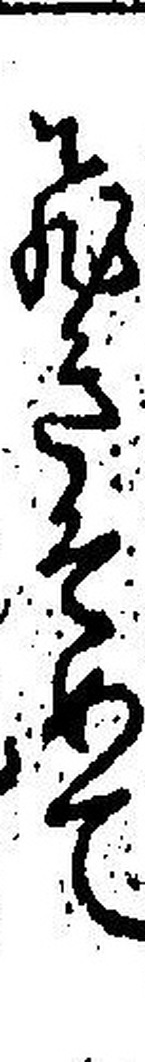ひきそめて
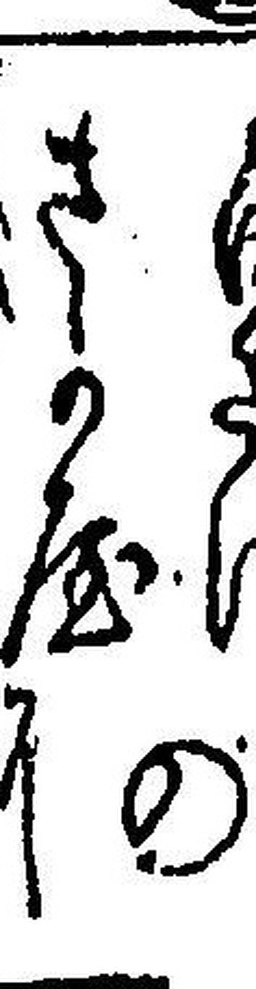さか屋に
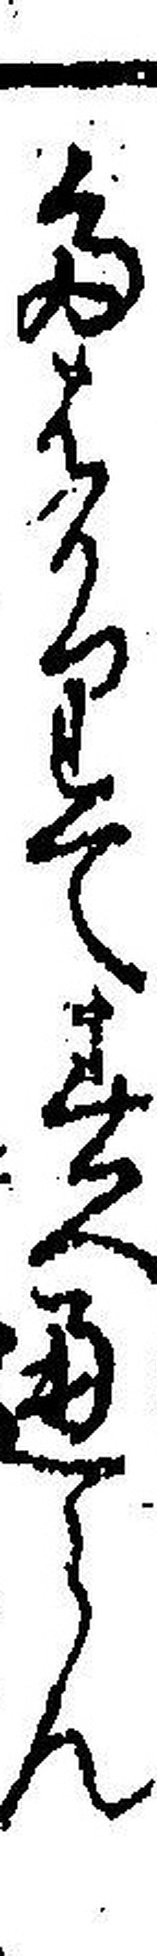たはかりて春へ通らん
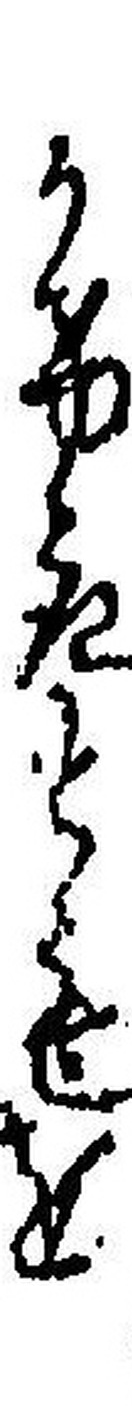かけ取ともを
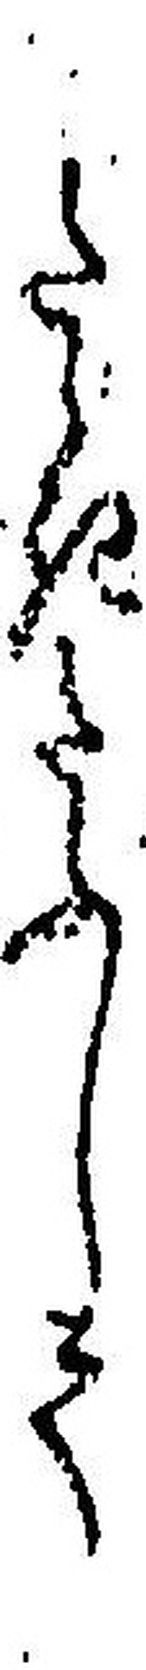たゝきたふして
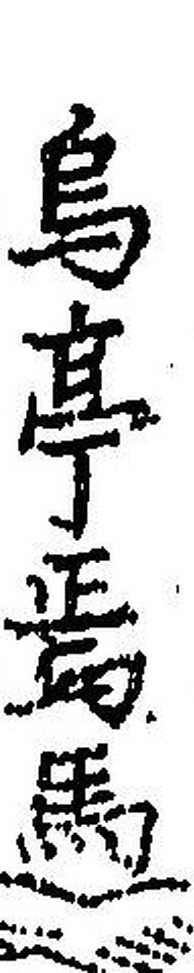烏亭焉馬
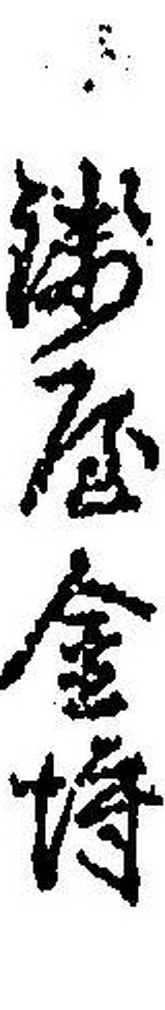銭屋金持
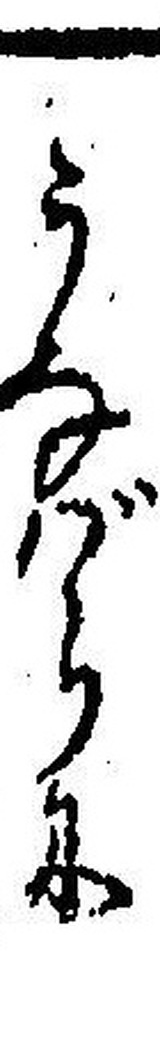うなばらに
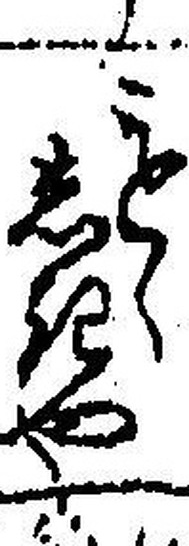しきや
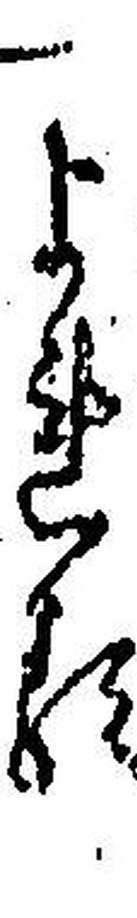よれる
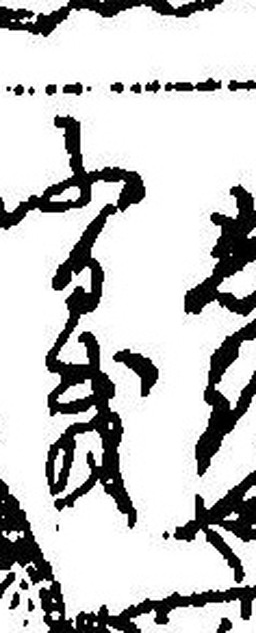ふるき
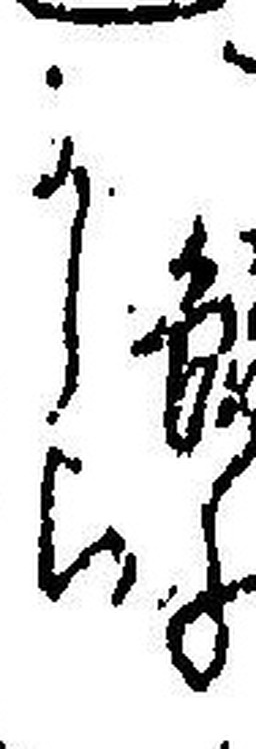かしら
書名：どうれ百人一首 / 鹿都部真顔(狂歌堂)編
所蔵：東京大学総合図書館 General Library in the University of Tokyo, JAPAN
